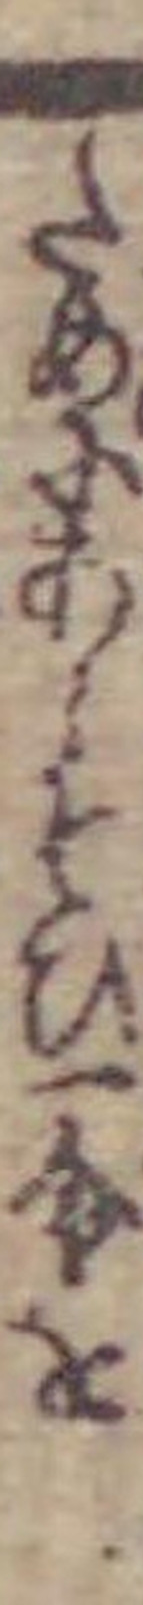ためにあらそひ一命を
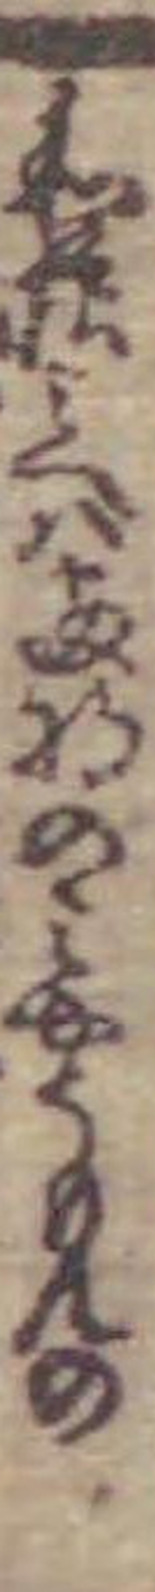和荘兵へは両将のみやうもんの
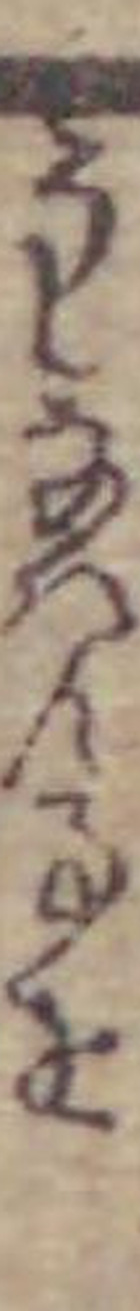うしなはん事を
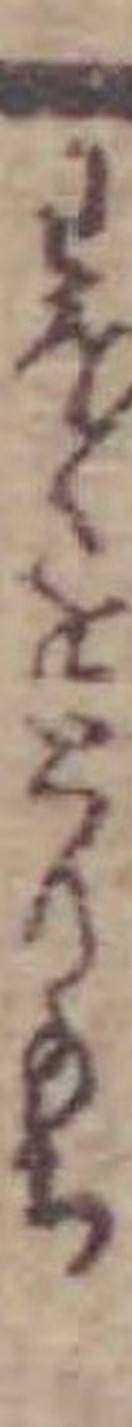わほくをとりもち
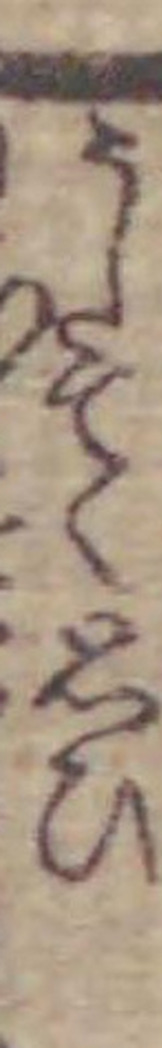うたてく思ひ
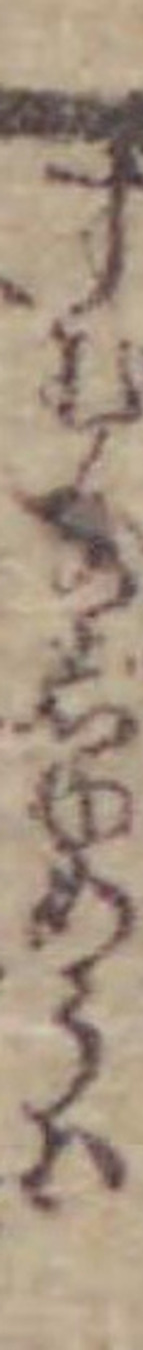すむ人のじゆめうは
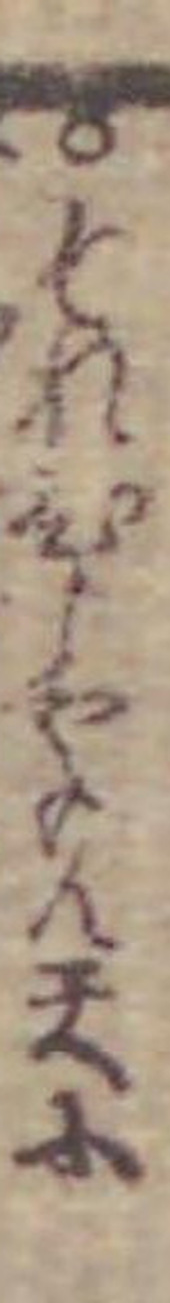○それひしやもん天に
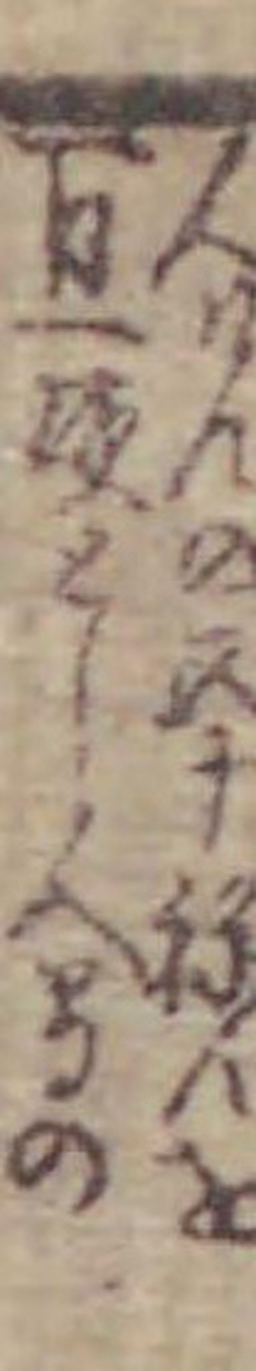一日一夜とし人間の
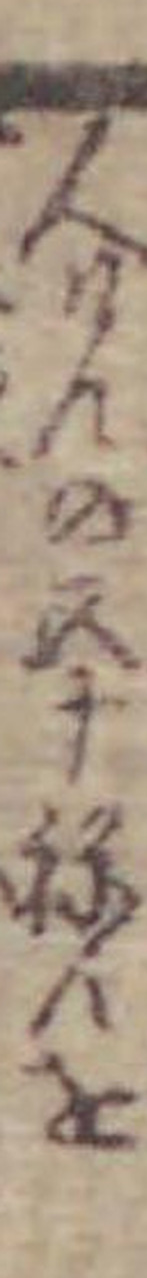人けんの五十ねんを
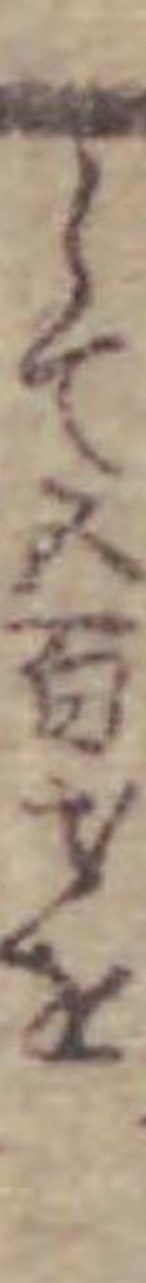して五百才を
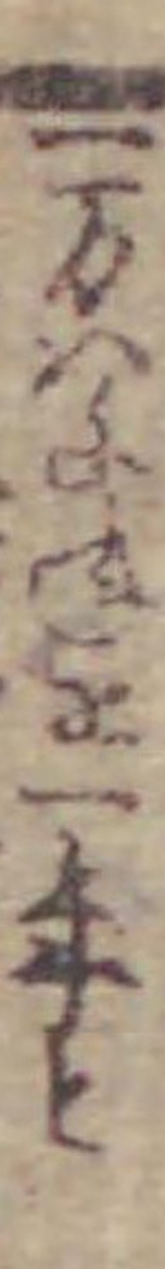一万は千年を一年と
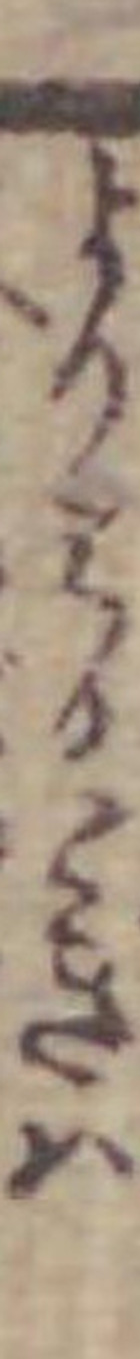よりみるときは
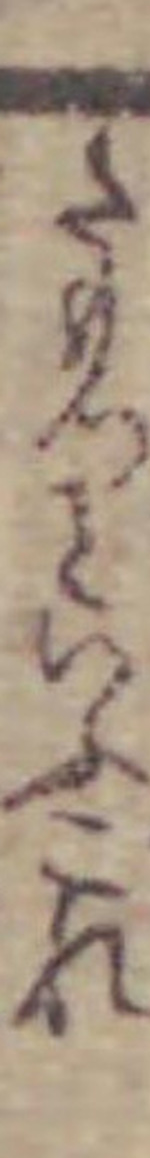たもつといふこれ
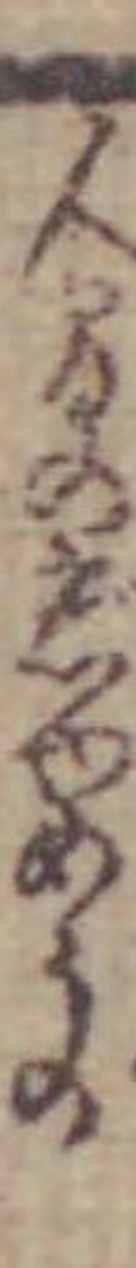人間のじゆめうの
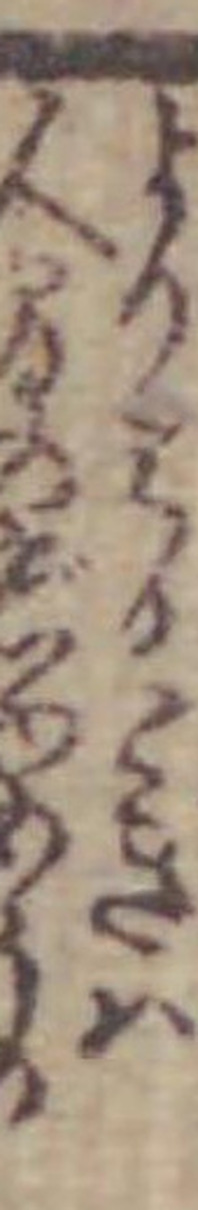人間のじゆめうの
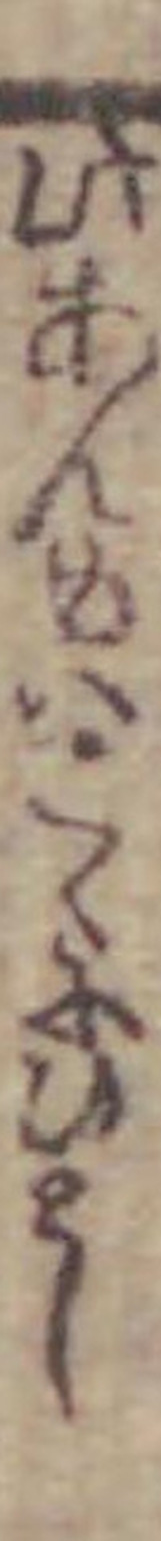此あんめいこくにひとし
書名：和荘兵衛後日話 : 3巻
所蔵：国立国会図書館 National Diet Library, JAPAN
